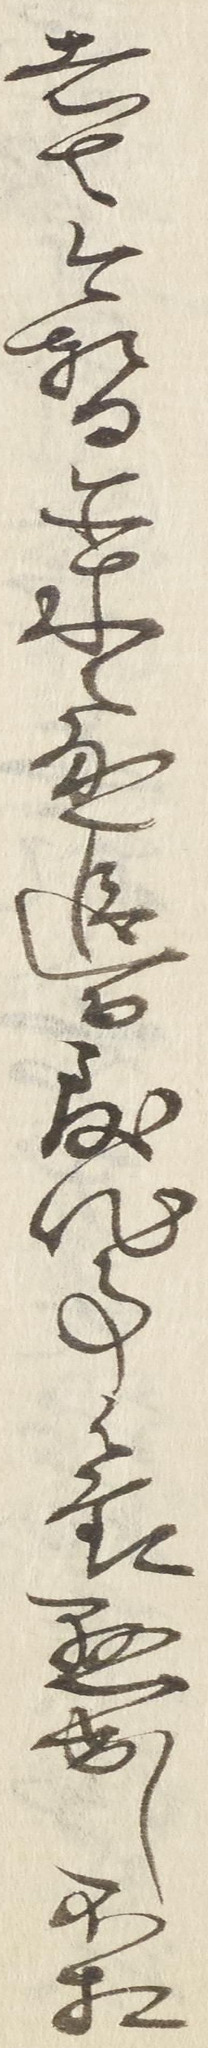者は今替所来候通追而致作事之節懸出し不相
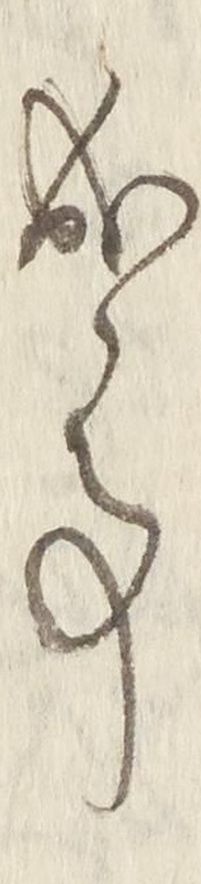成候事
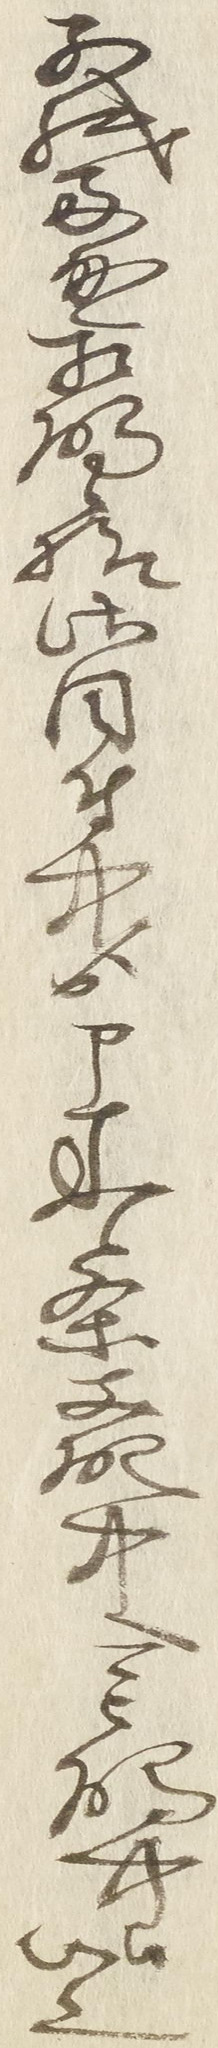別紙両通相触候様御目付中ゟ申来候条支配中へ可被触中候以上
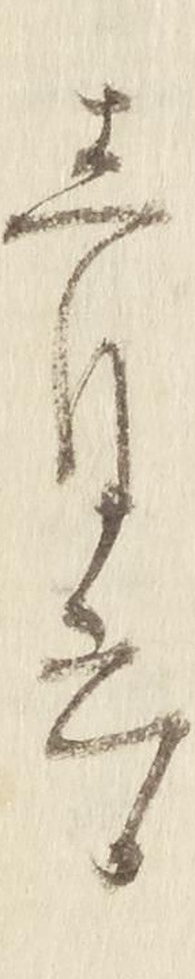十二月六日
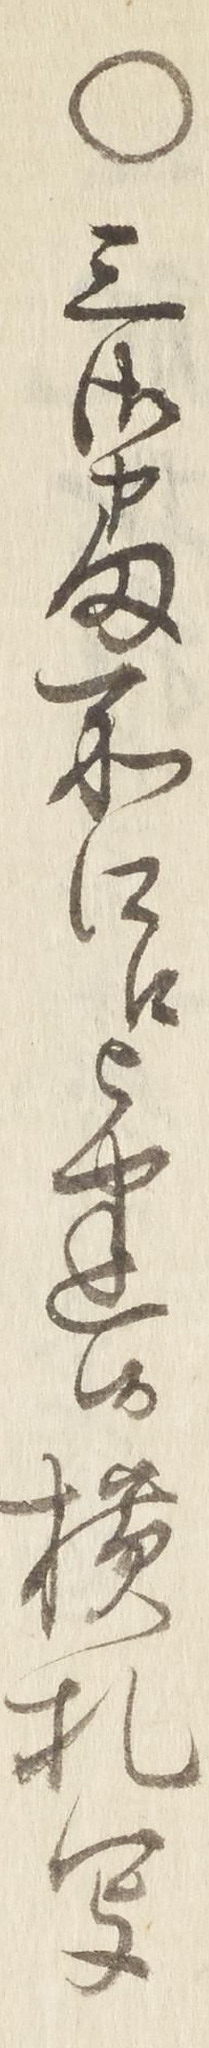◯三御番所口江被建候横札写
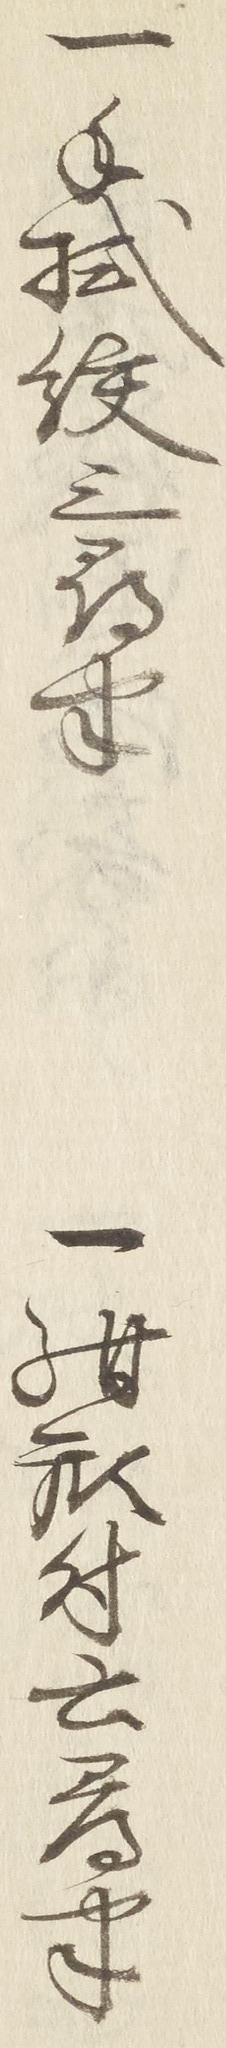一手拭紋三尋半一紺形付六尋半
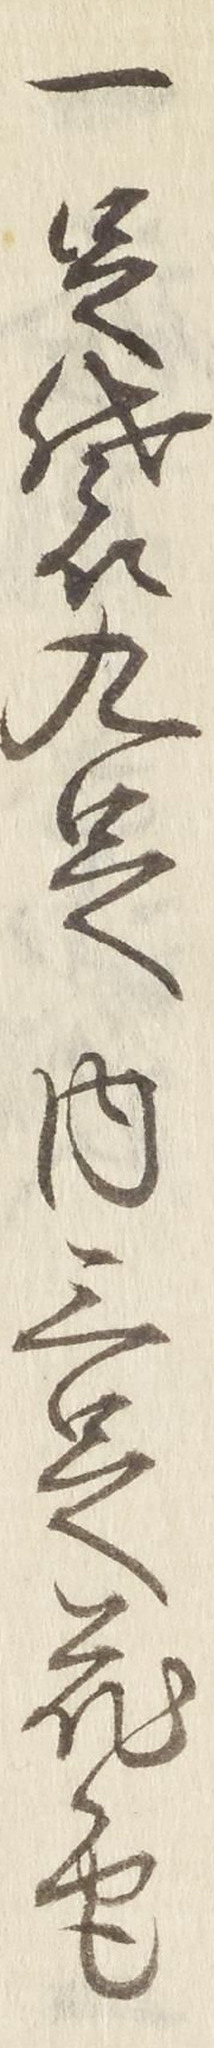一足袋九足内三足花色
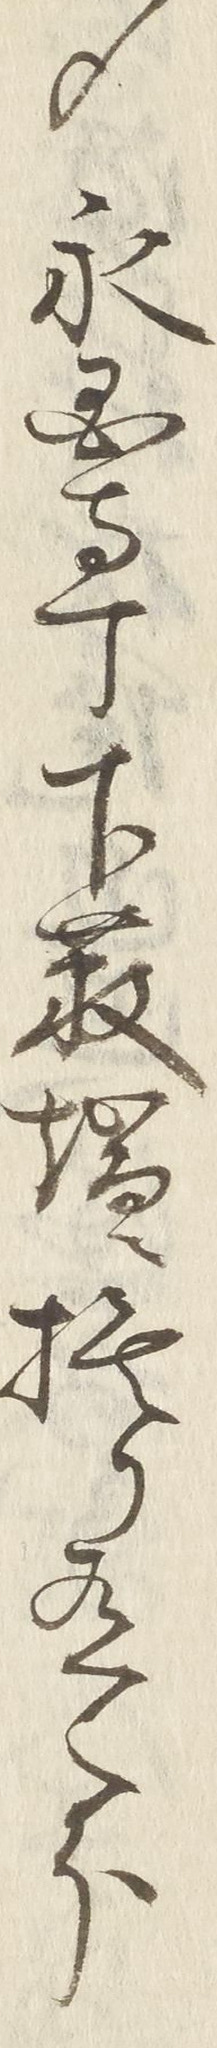〆永国寺丁下藪端二捨り有之分
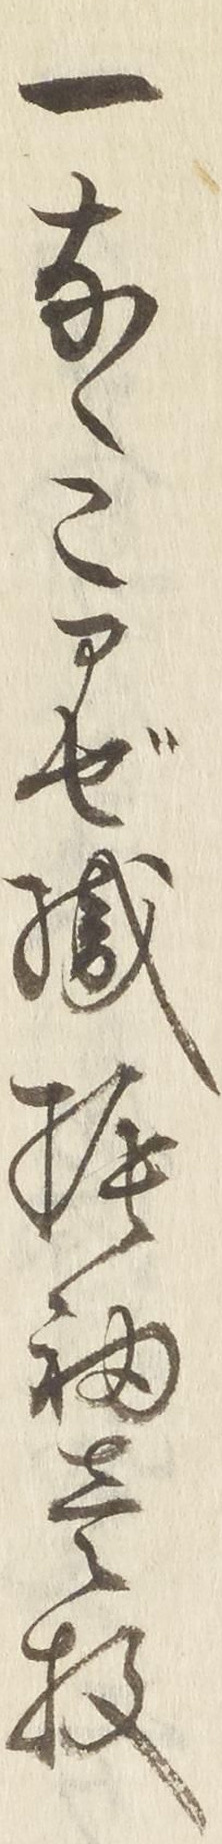一なゝこあぜ織振袖壱枚
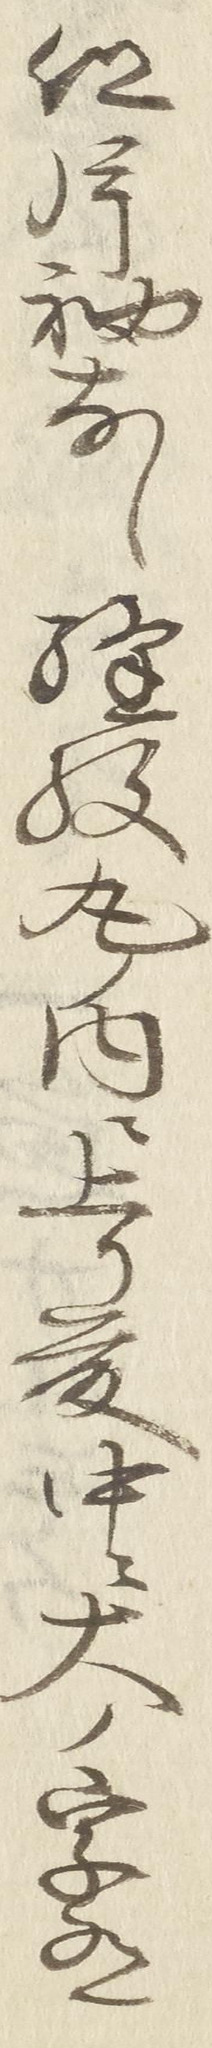但片袖なし縫紋丸の内二上り藤中に大の字有
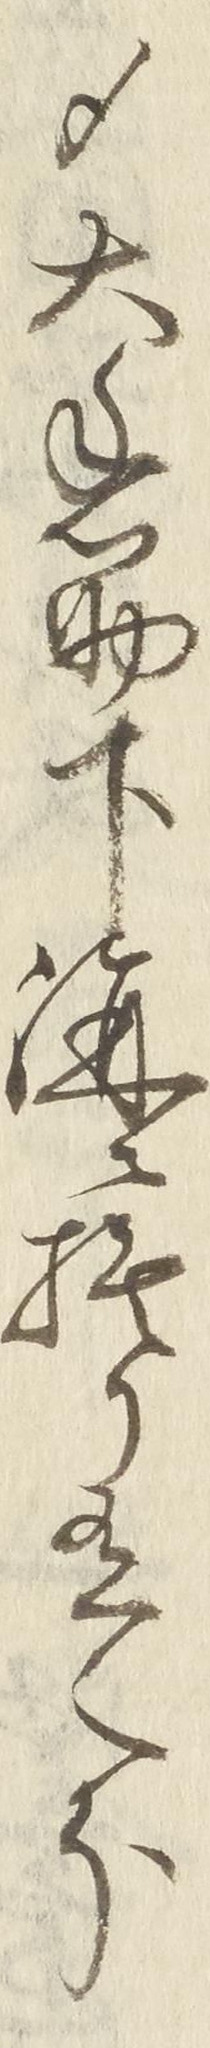〆大手筋下溝に捨り有之分
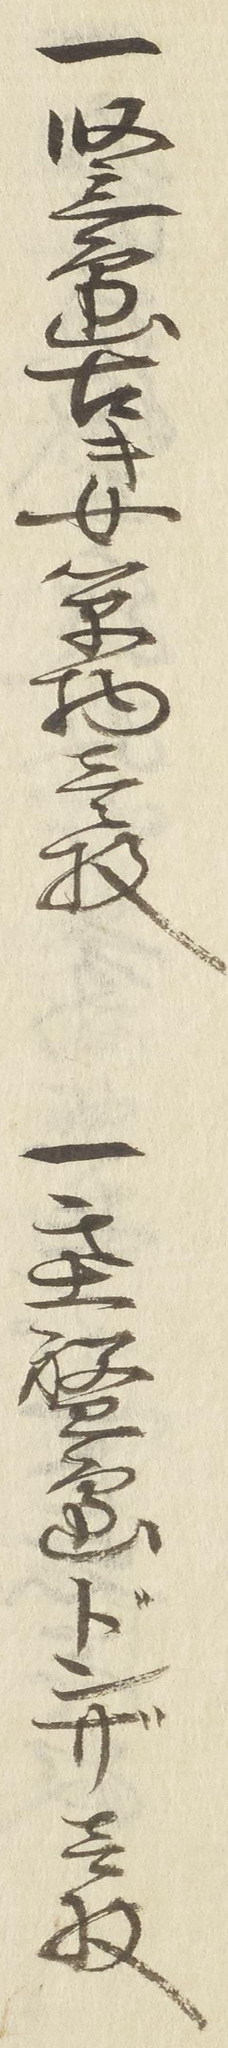一竪嶋古き女単物壱枚一基盤嶋ドンザ壱枚

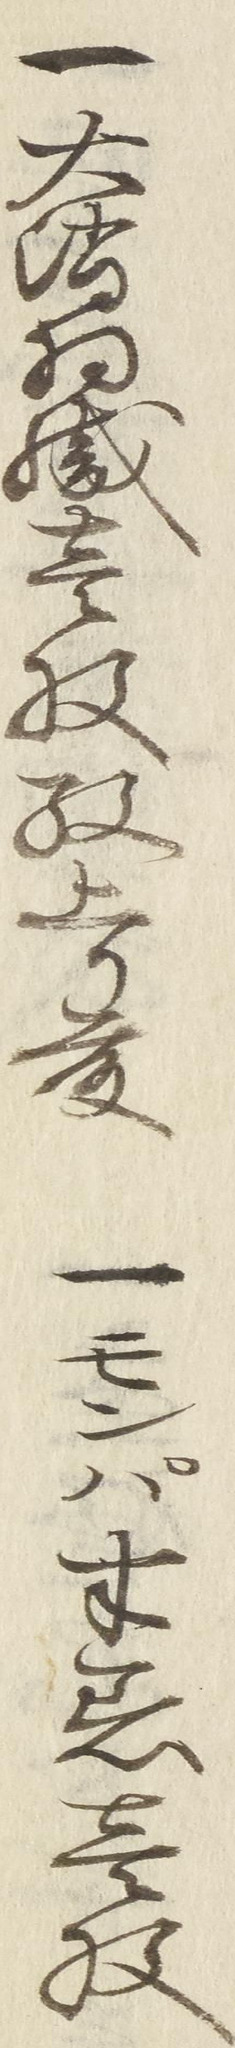一火消羽織壱枚紋上り藤一モンパ半着壱枚
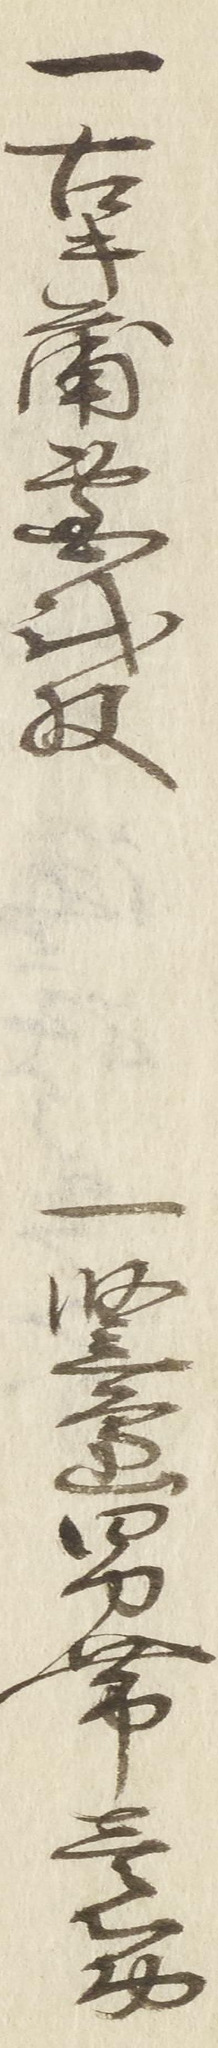一古き蒲団弐枚一竪嶋男帯壱筋
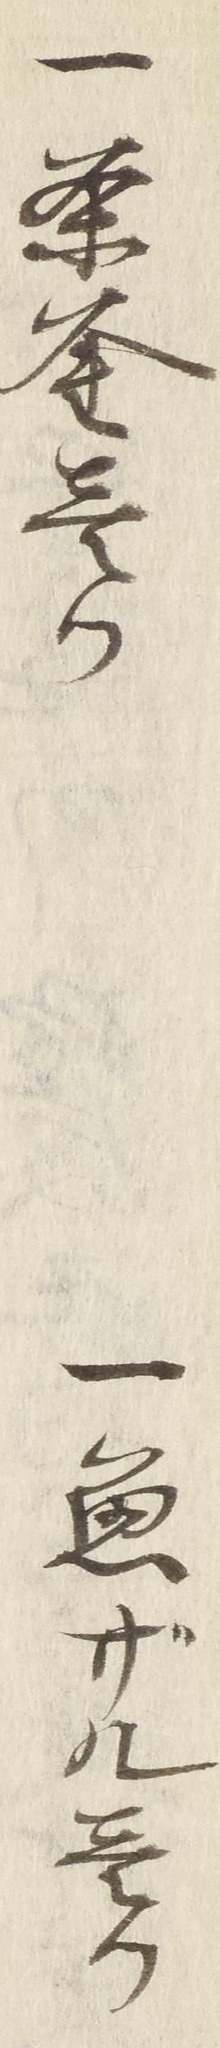一茶釜壱ッ一魚ザル壱ッ
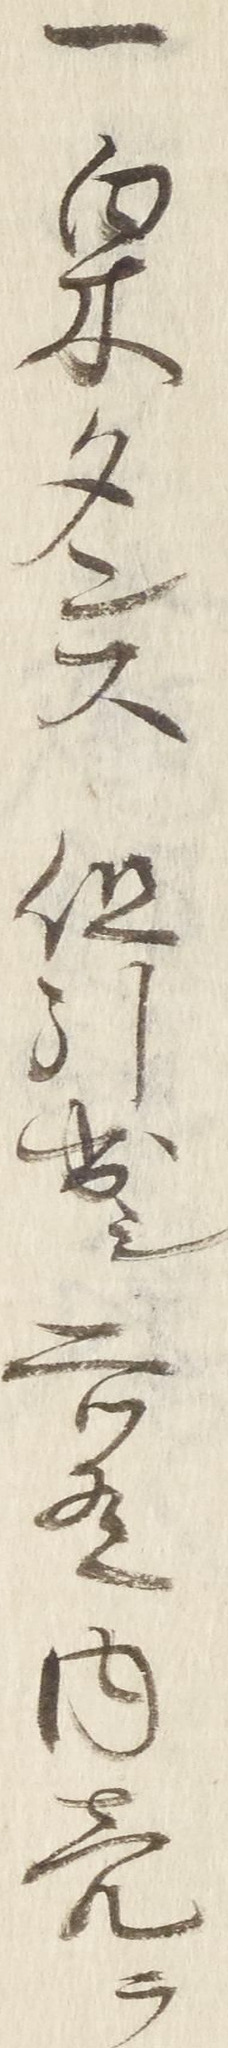一白木タンス但引出し二ッ有内売ラ
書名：地震記　下
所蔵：東京大学地震研究所図書室 Earthquake Research Institute Library, The University of Tokyo, JAPAN
